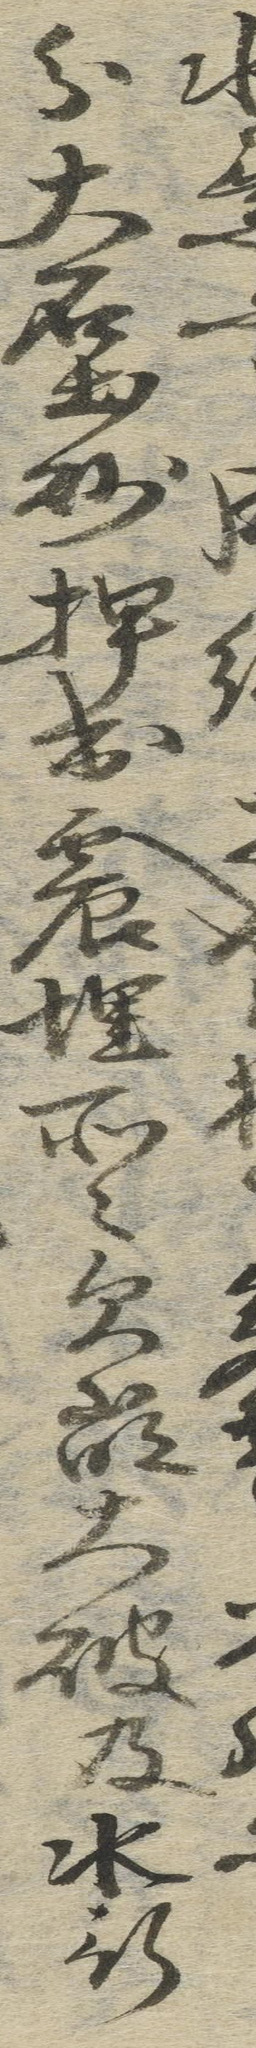分大石土砂押出震埋所々欠崩大破及水行
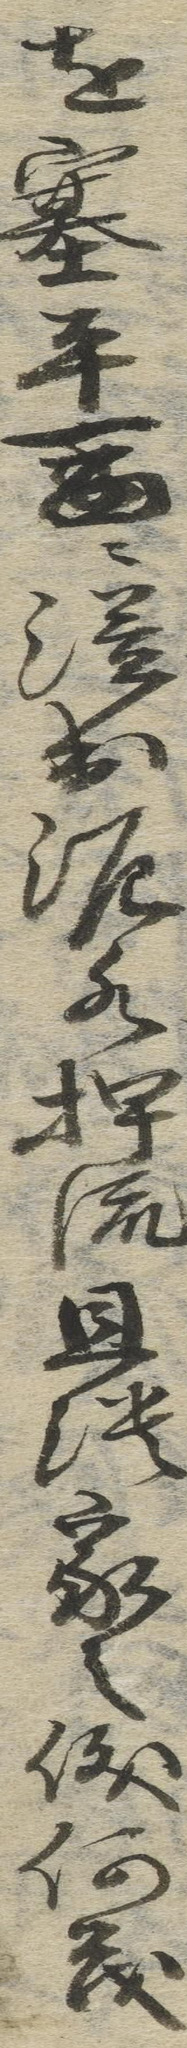を塞平一面二溢出泥水押流且潰家之儀何も
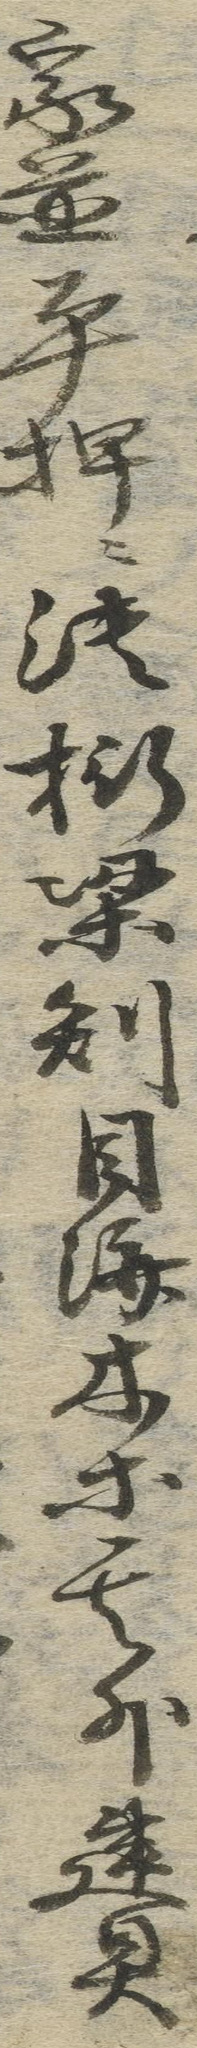家並平押二潰桁梁割目済木等其外建具
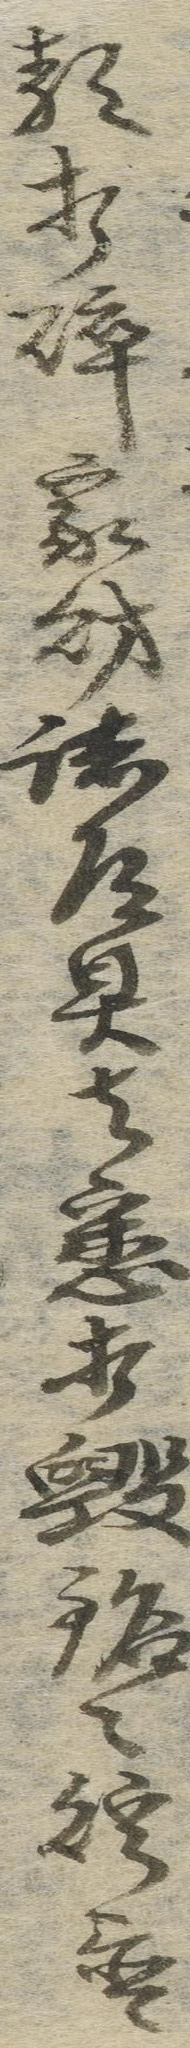類打砕家財諸道具は悉打毀銘々貯置候
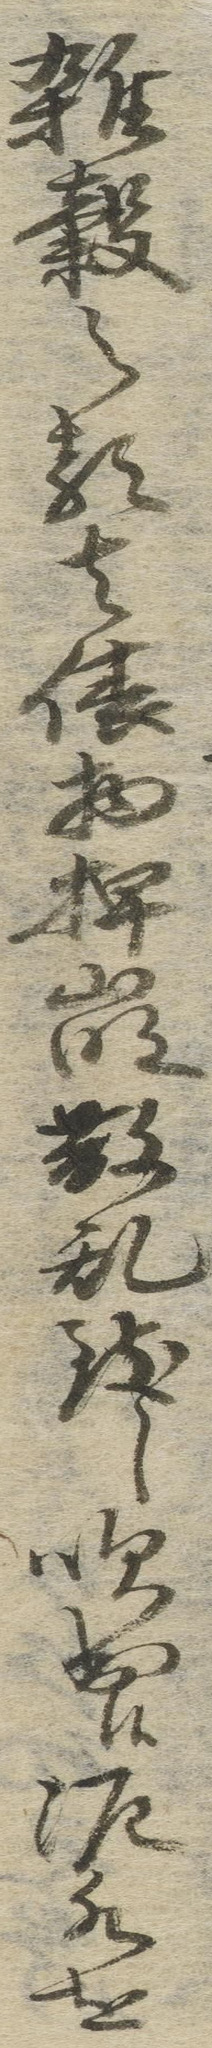雑穀之類は俵物押崩散乱致し吹出候泥水を

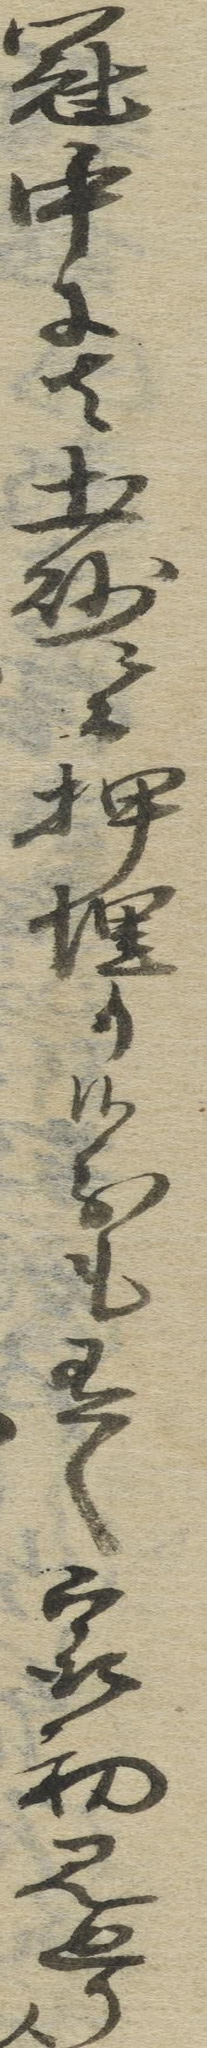冠り中には土砂二而押埋り候分も有之最初見廻り候
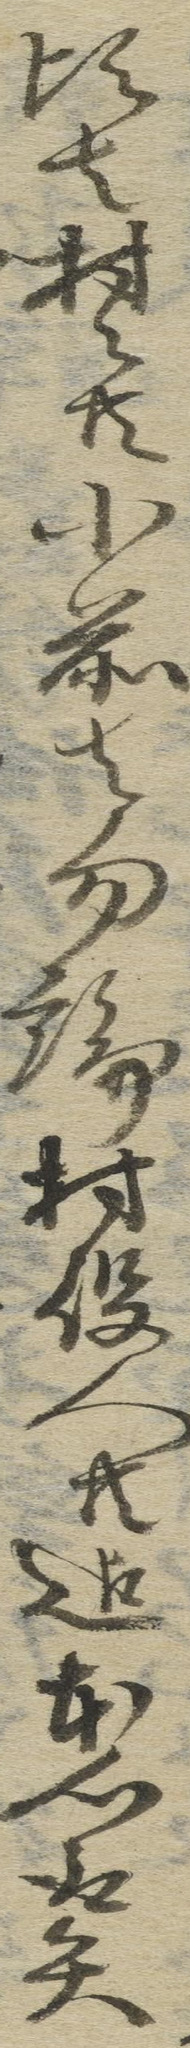頃は村々共小前は勿論村役人共迄本心取失
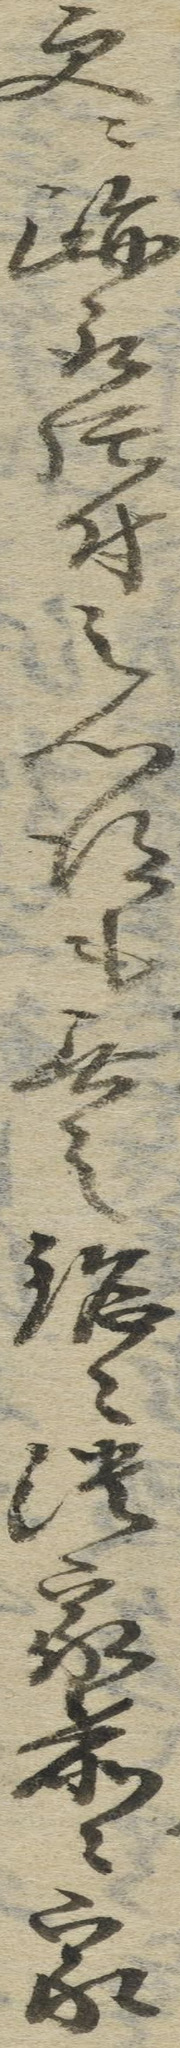更二跡取片付之心得も無之銘々潰家前二家
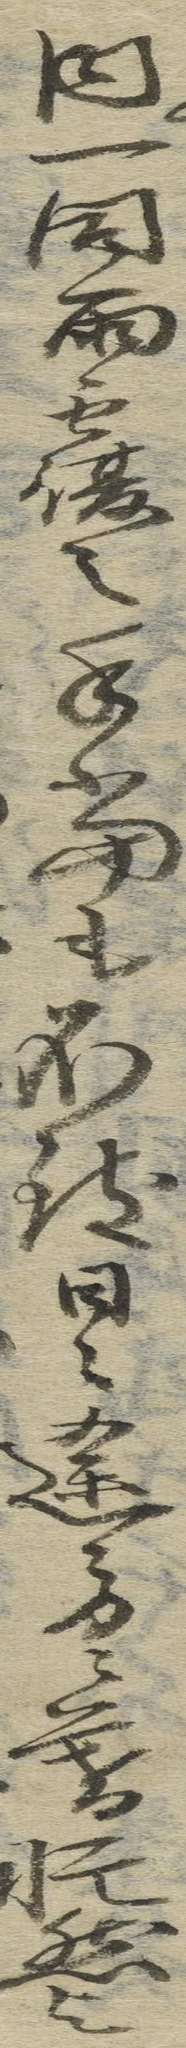内一同雨覆之手当も不致日々途方二暮茫然と
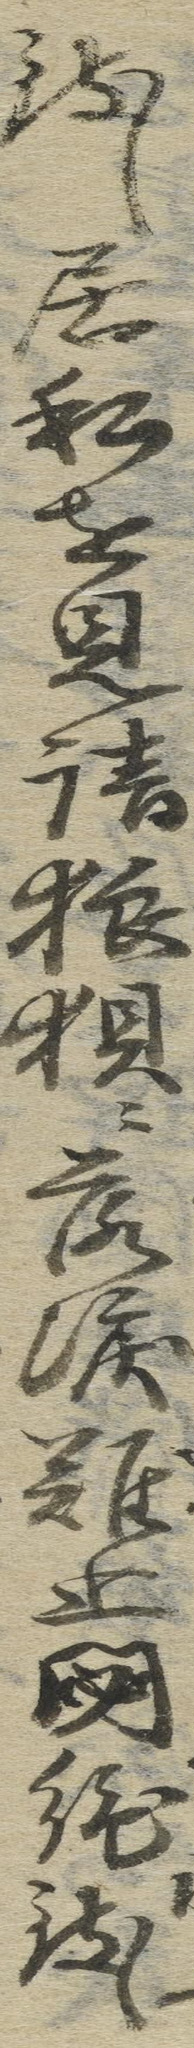致し居私を見請狼狽二落涙難止悶絶致し
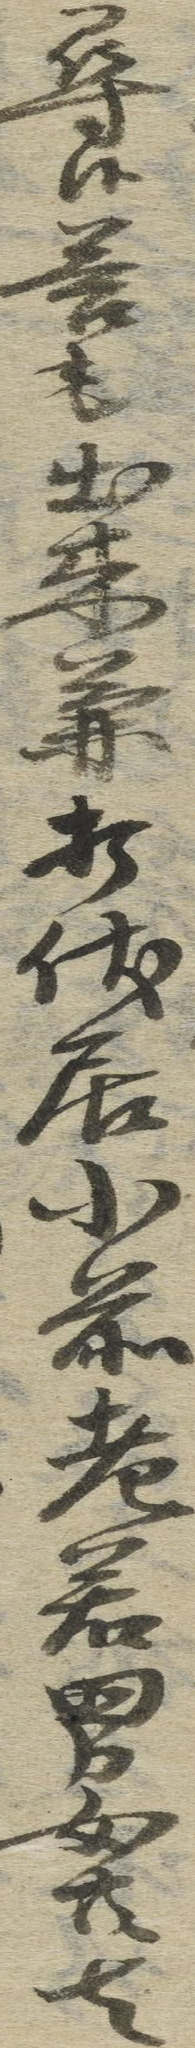尋候答も出来兼相伏居小前老若男女共は
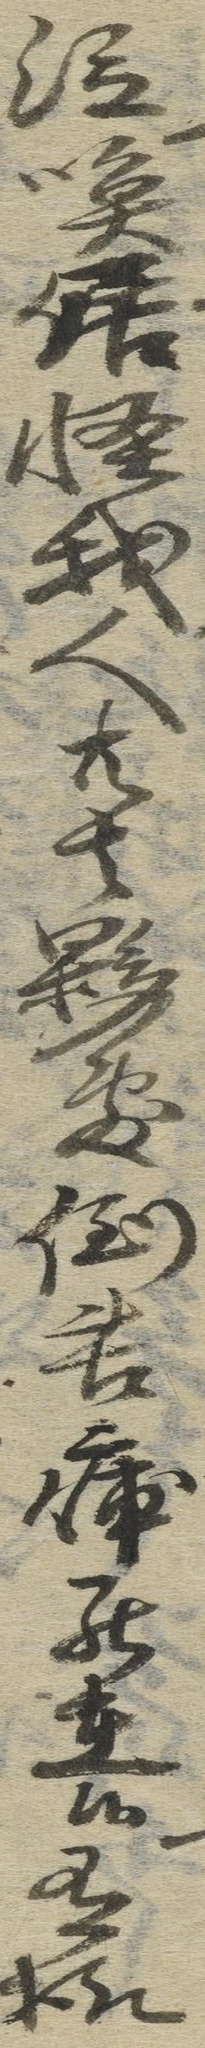泣喚居怪我人共は夥敷倒苦痛罷在候有様
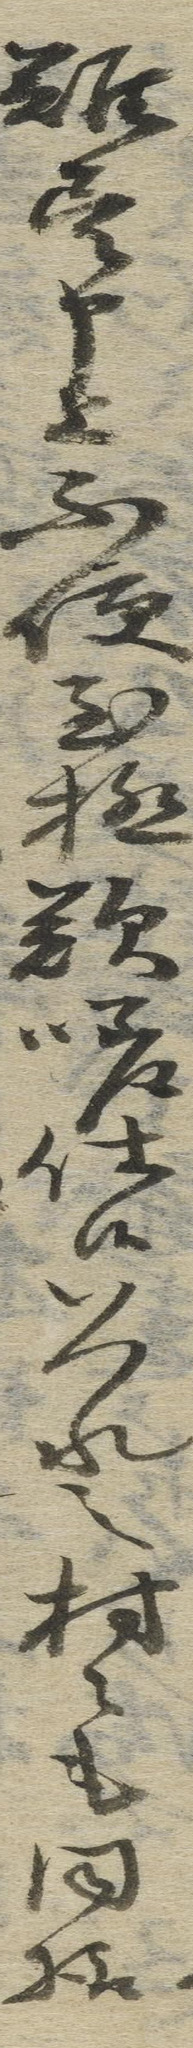難盡申上不便至極歎嗟仕候いつれ之村々も同様
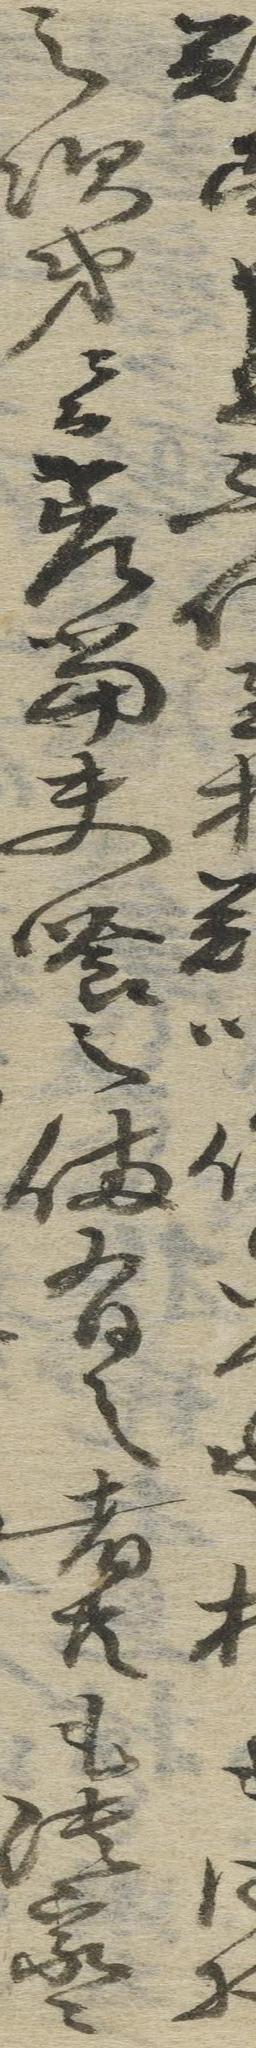之次第二而差当夫喰之備有之者共も潰家二
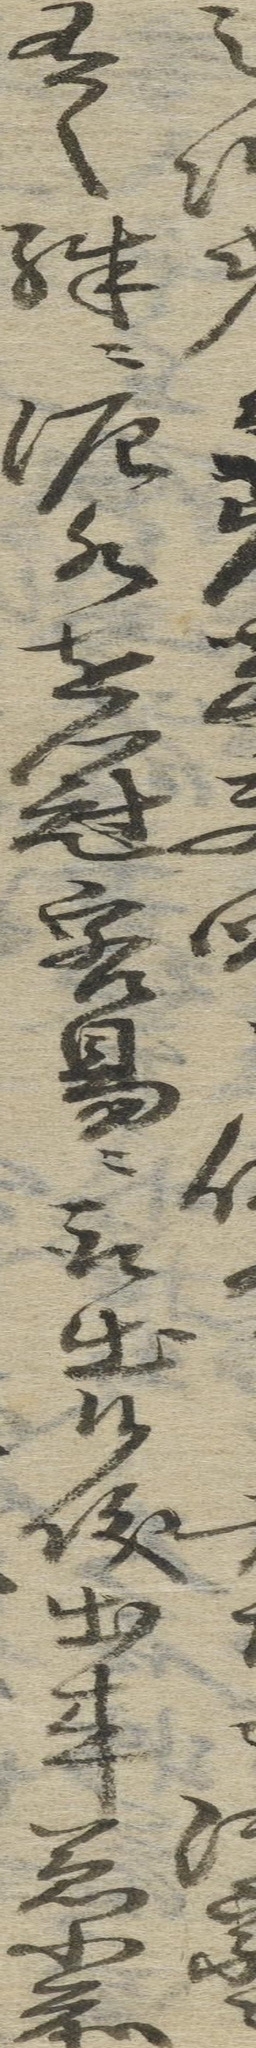有之殊二泥水を冠容易二取出候儀出来兼小前
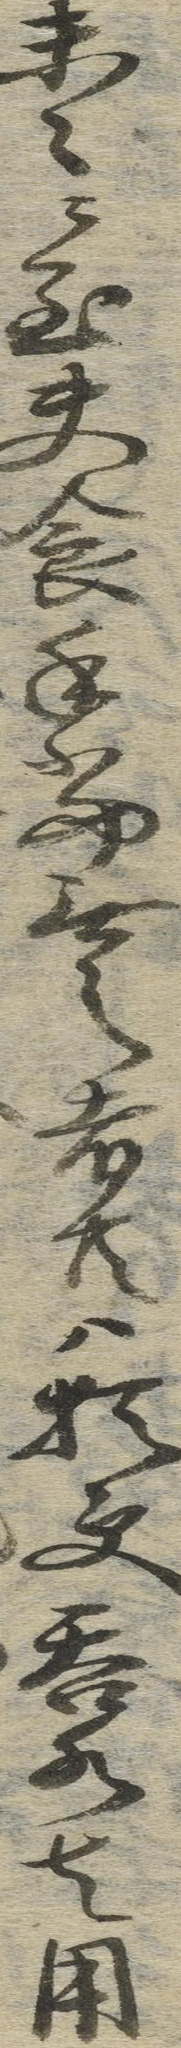末々二至夫食手当無之者共ハ猶更呑水は用
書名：信濃越後　地震書留
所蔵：東京大学地震研究所図書室 Earthquake Research Institute Library, The University of Tokyo, JAPAN
